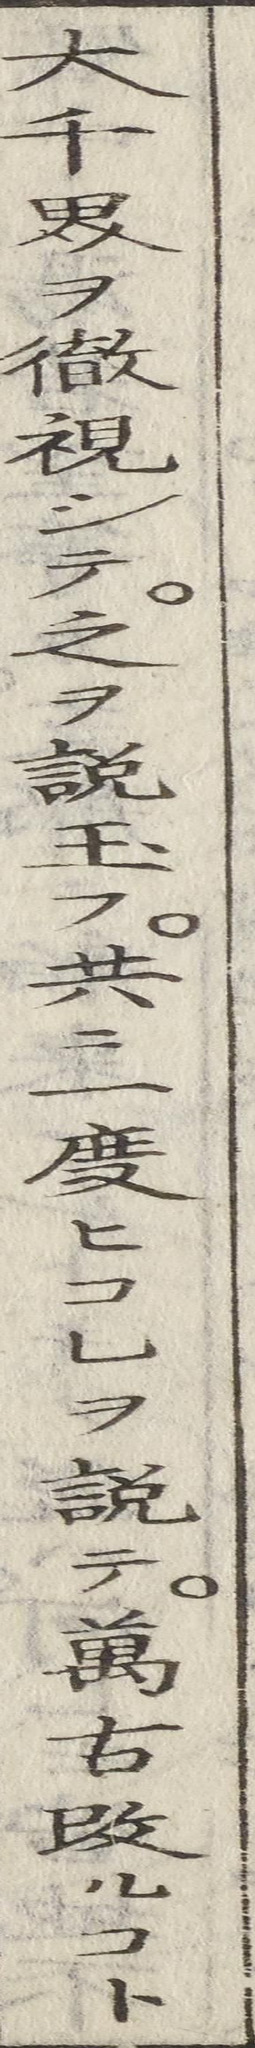大千界ヲ徹視シテ。之ヲ説玉フ。共ニ一度ヒコレヲ説テ。万古改ルコト
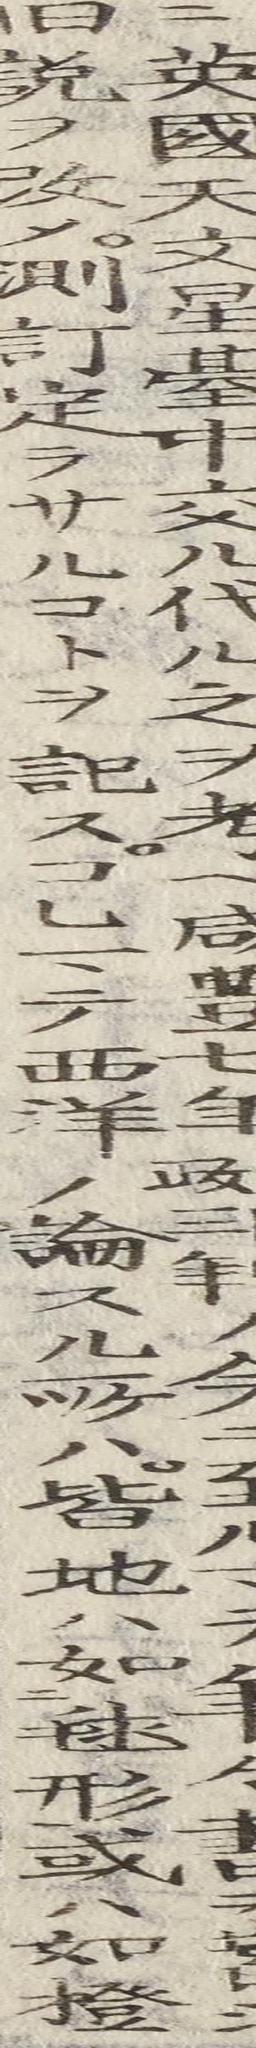旧説ヲ改メ。測訂定ラサルコトヲ記ス。コレマテ西洋ノ論スル所ハ。皆地ハ如毬形或ハ如橙
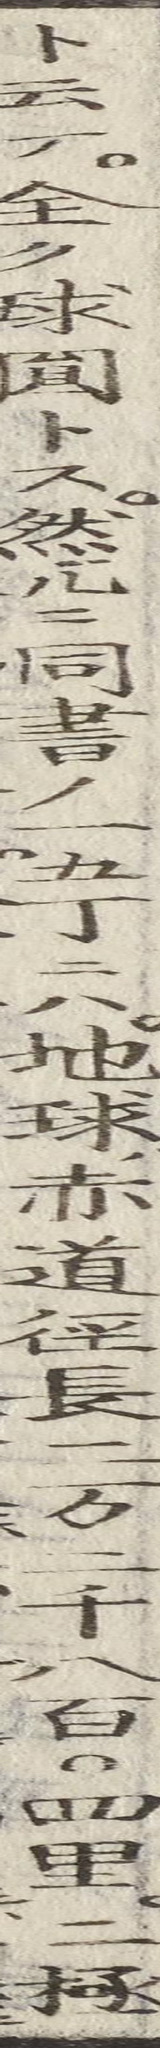ト云テ。全ク球円トス。然ルニ同書ノ一五丁ニハ。地球赤道径長二万二千八百０四里。二極
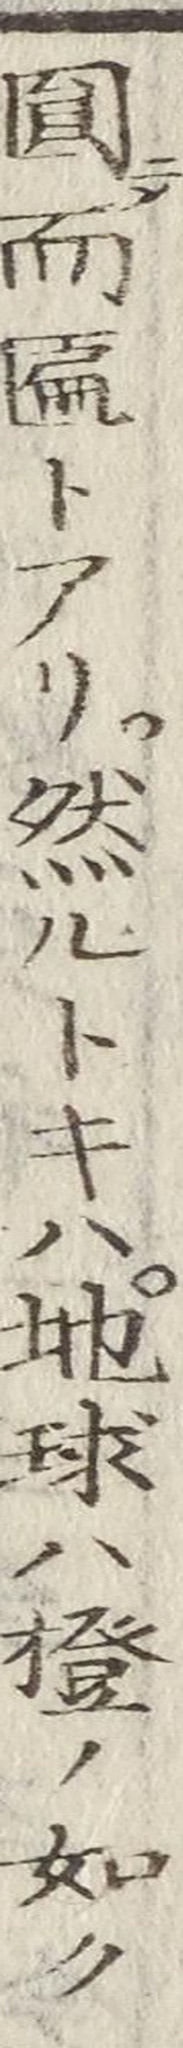円而扁トアリ。然ルトキハ。地球ハ橙ノ如ク
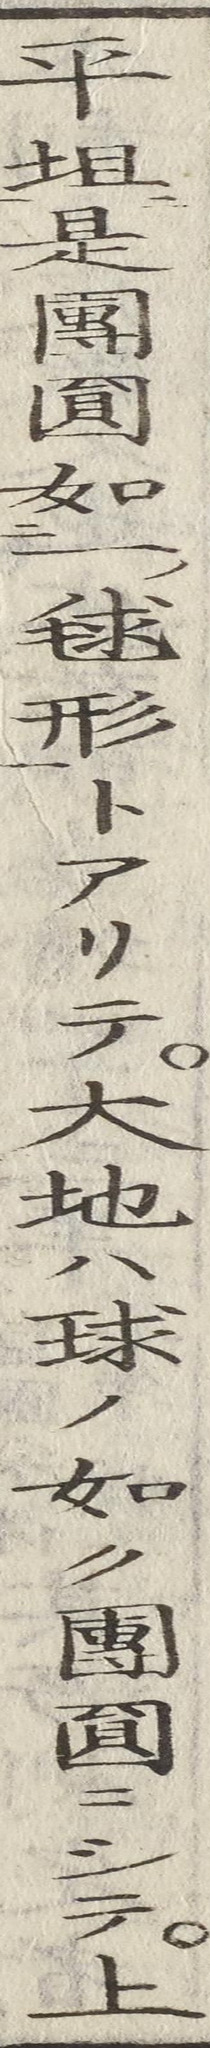平坦二是団円如一毬形トアリテ。大地ハ球ノ如ク団円ニシテ。上
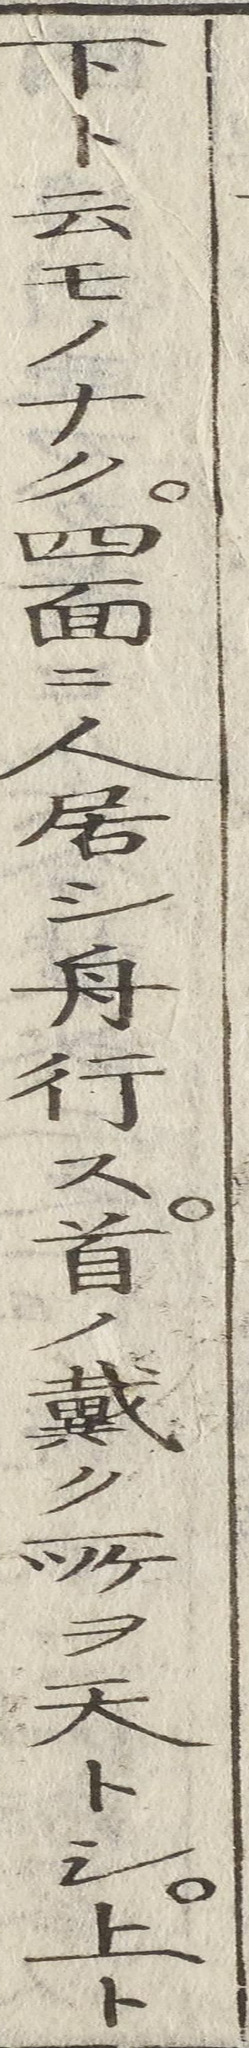下ト云モノナク。四面ニ人居シ舟行ス。首ノ戴ク所ヲ天トシ。上ト
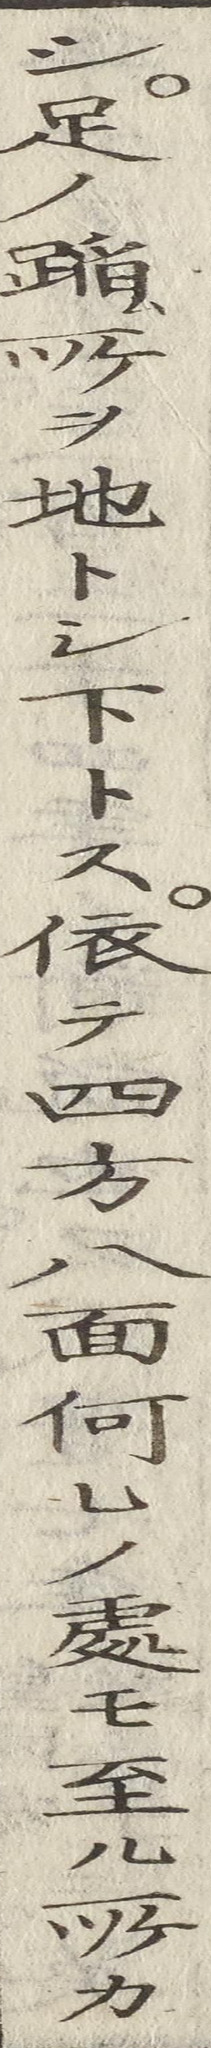シ。足ノ踏所ヲ地トシ下トス。依テ四方八面何レノ処モ至ル所カ
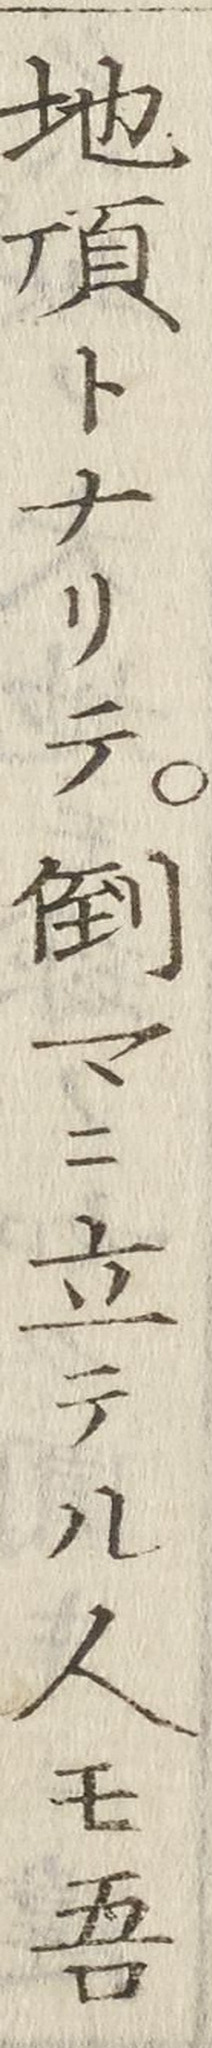地頂トナリテ。倒マニ立テル人モ吾
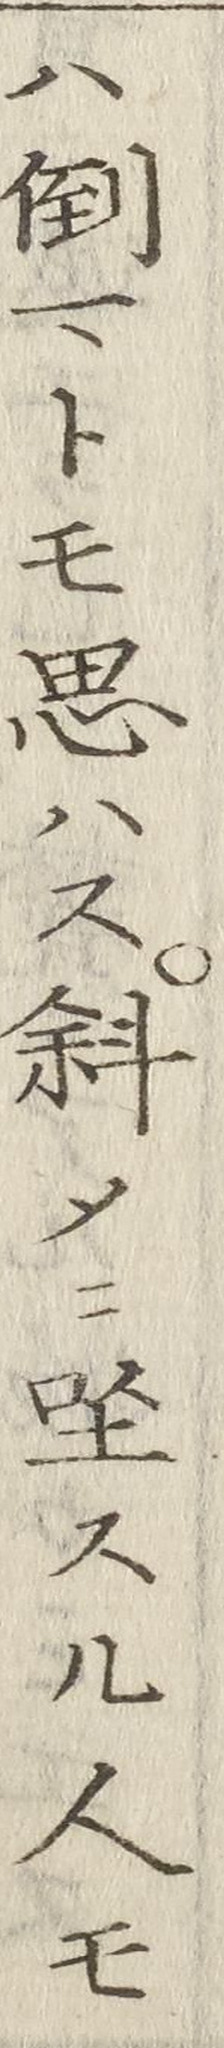ハ倒マトモ思ハス。斜メニ坐スル人モ
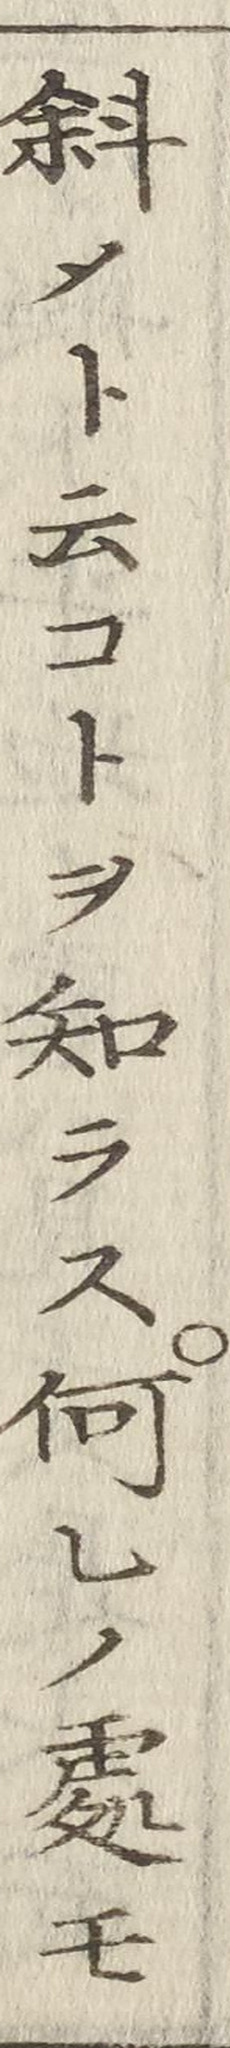斜メト云コトヲ知ラス。何レノ処モ
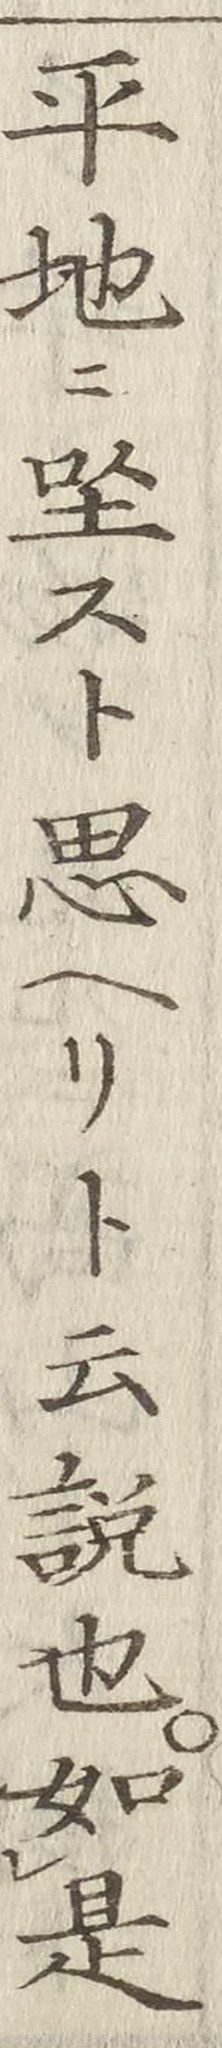平地ニ坐スト思ヘリト云説也。如是
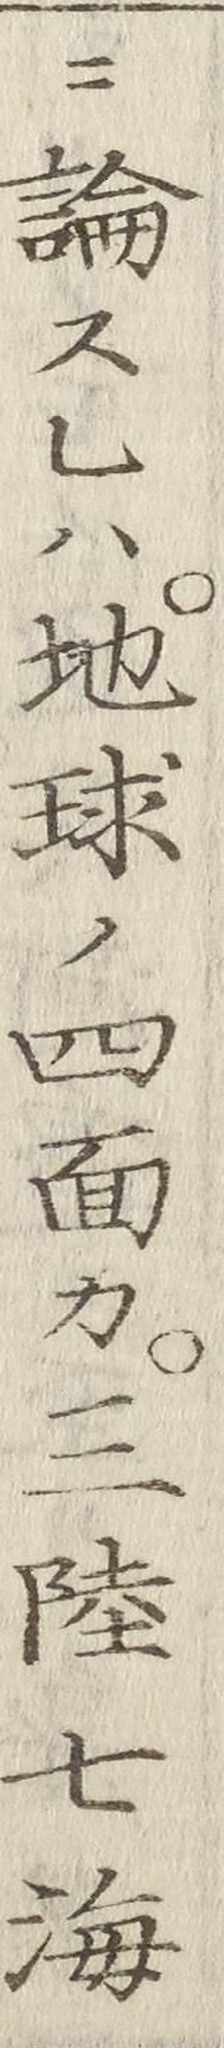ニ論スレハ。地球ノ四面カ。三陸七海
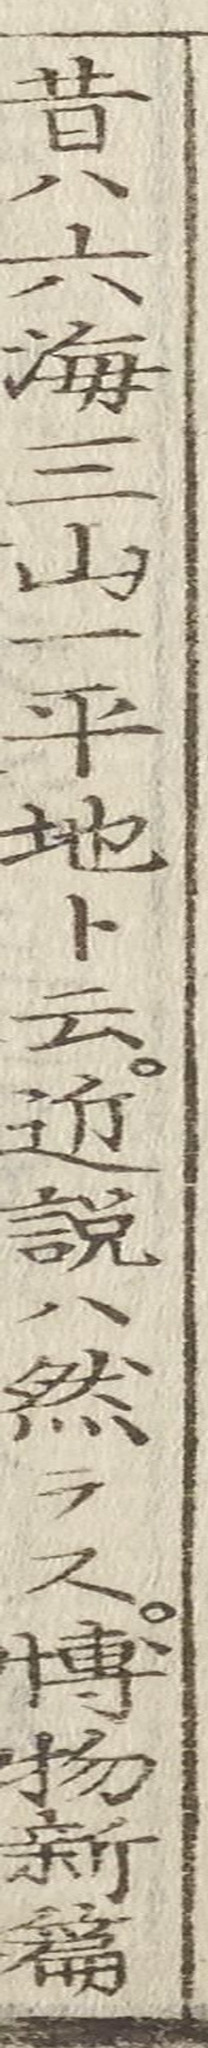昔ハ六海三山一平地ト云。近説ハ然ラス。博物新篇
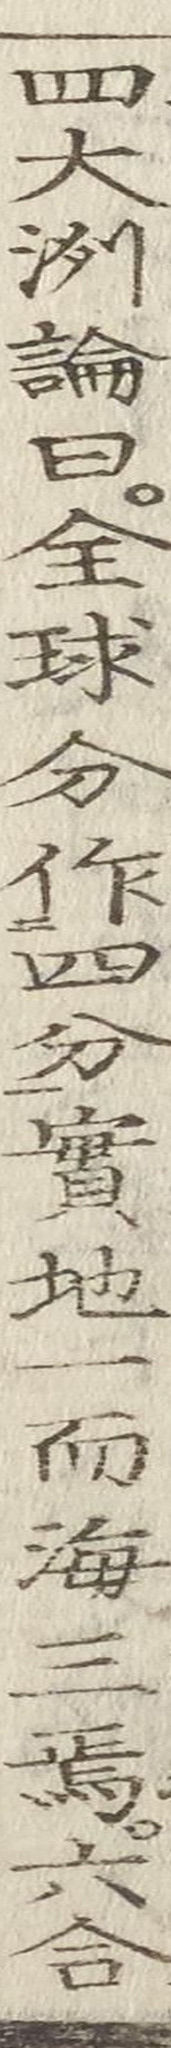四大洌論曰。全球分作四分実地一而海三焉。六合
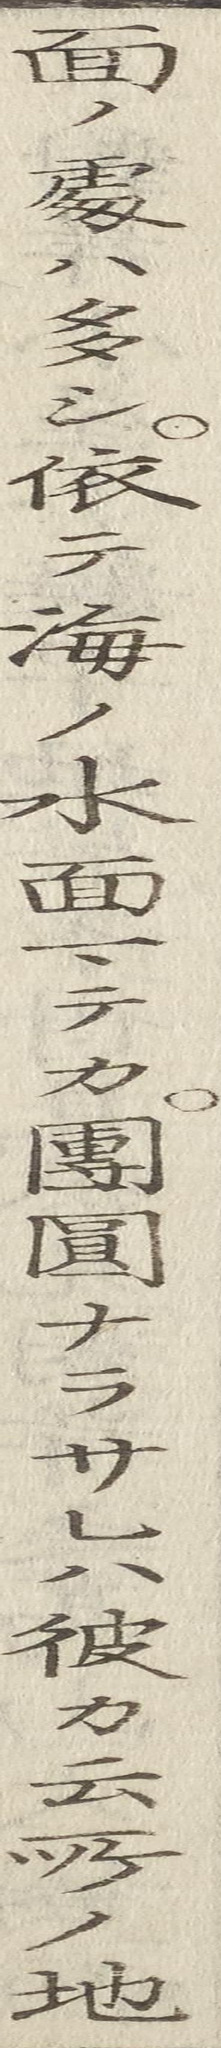面ノ処ハ多シ。依テ海ノ水面マテカ。団円ナラサレハ彼カ云所ノ地
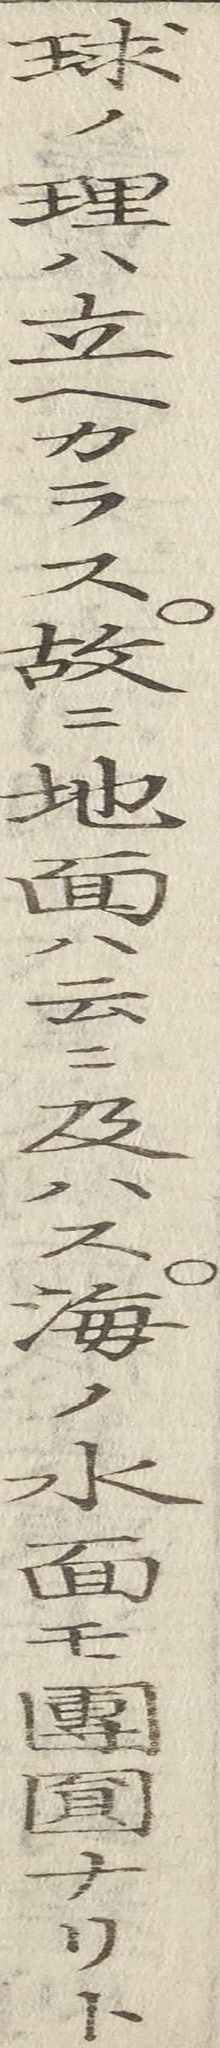球ノ理ハ立ヘカラス。故ニ地面ハ云ニ及ハス。海ノ水面モ団円ナリト
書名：護法新論　中
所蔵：東京大学地震研究所図書室 Earthquake Research Institute Library, The University of Tokyo, JAPAN
